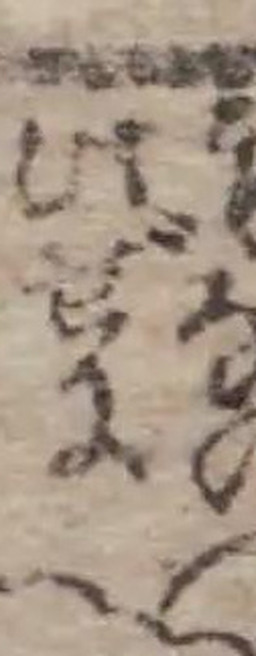此ぜに
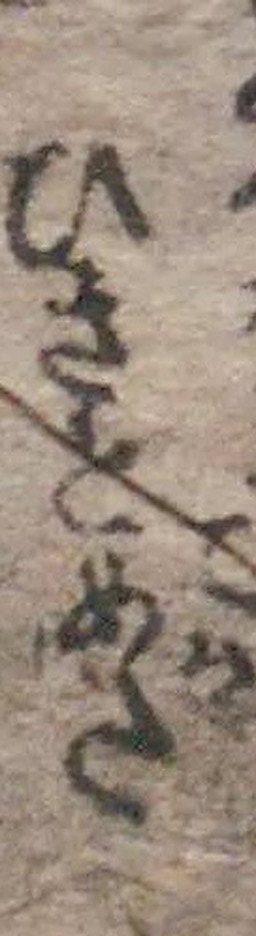ひきとめた
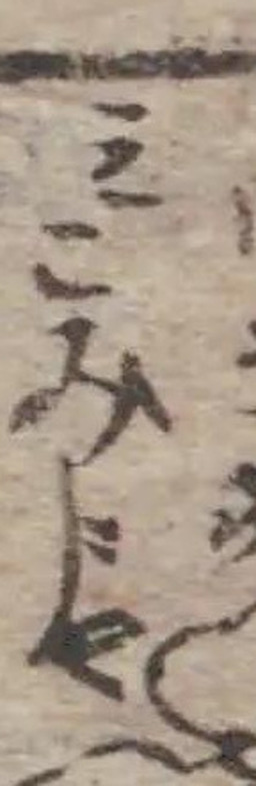みこみじや
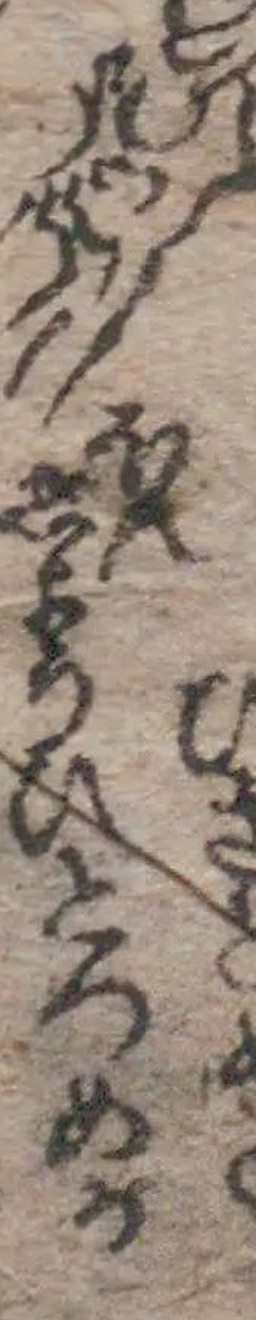しようひとつめか
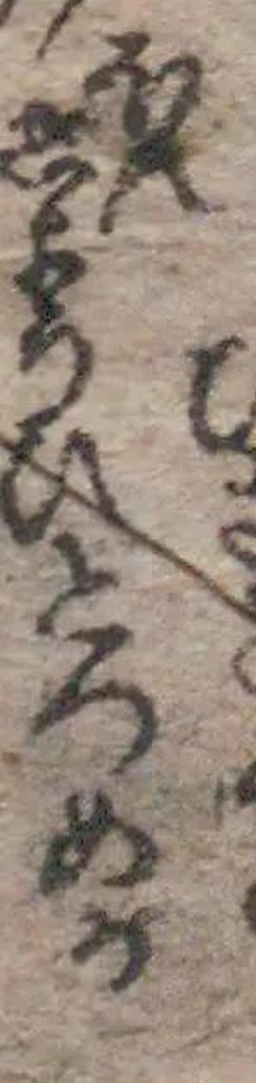しようひとつめか

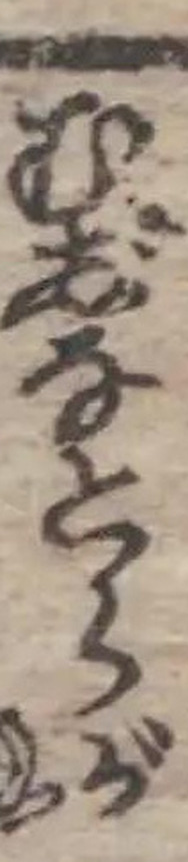むじなとらが
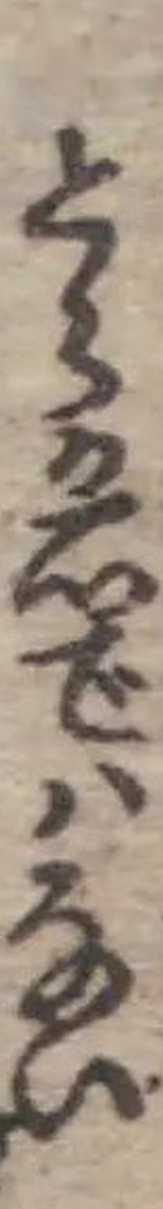とらか石ではない
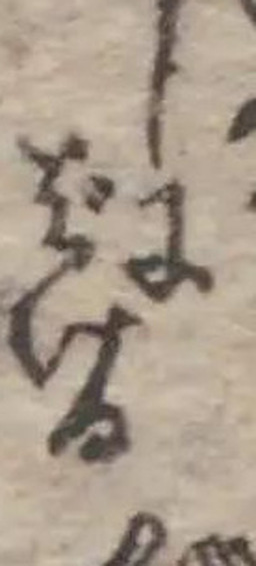ばける
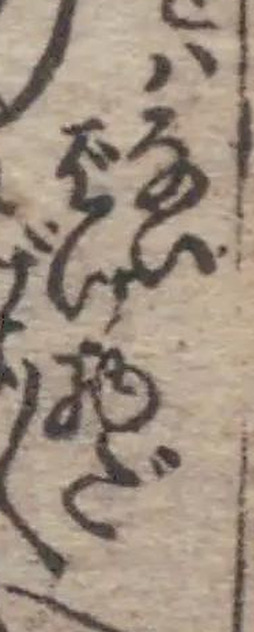ばけ物だ
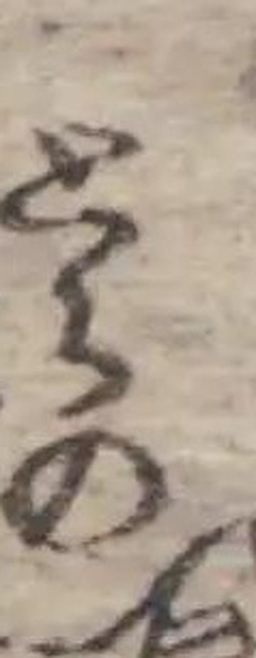とらの
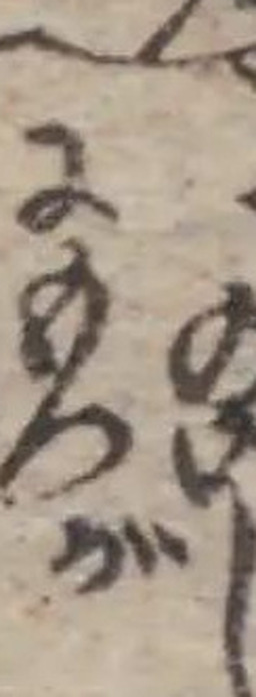にもつが
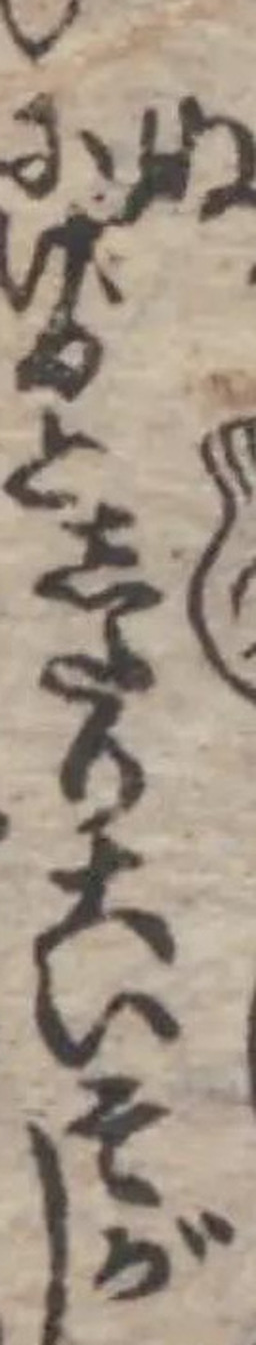にけるとしたり大いそが
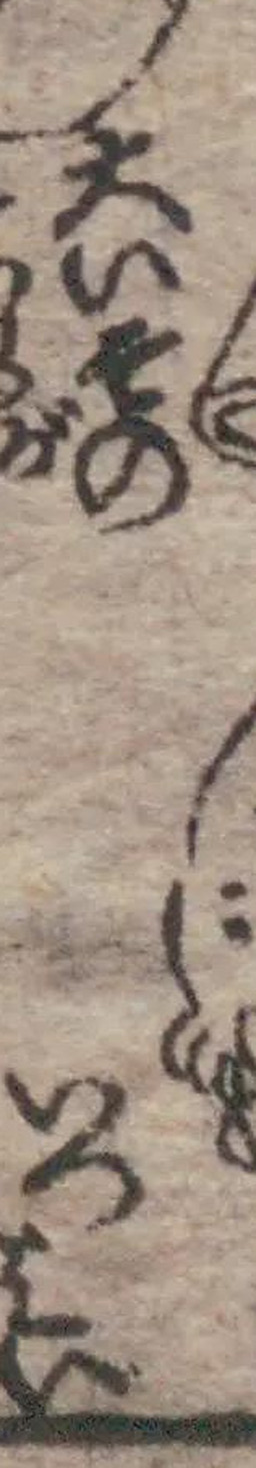いつはい
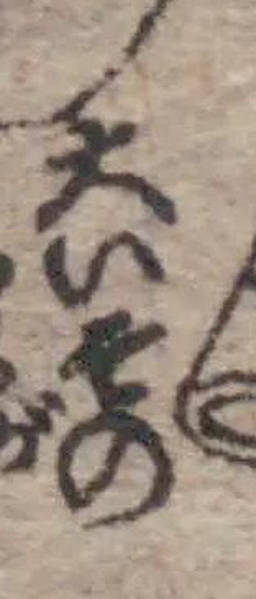大いその
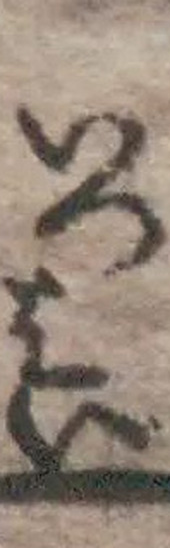いつはい
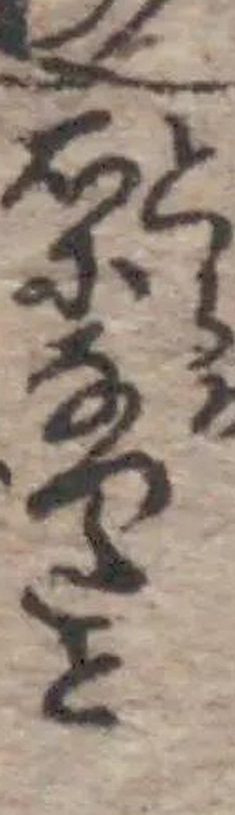石になつたと
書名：大磯地蔵咄 2巻
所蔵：国立国会図書館 National Diet Library, JAPAN
